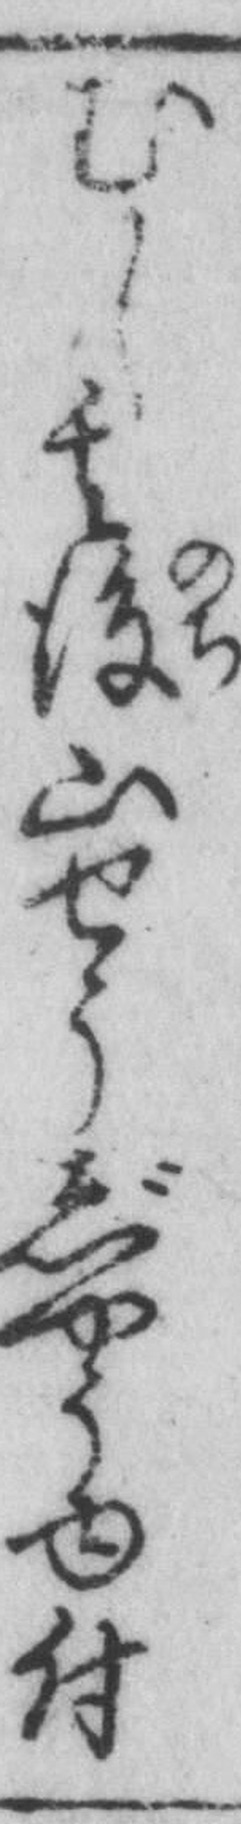むし其後山せうじやうゆ付
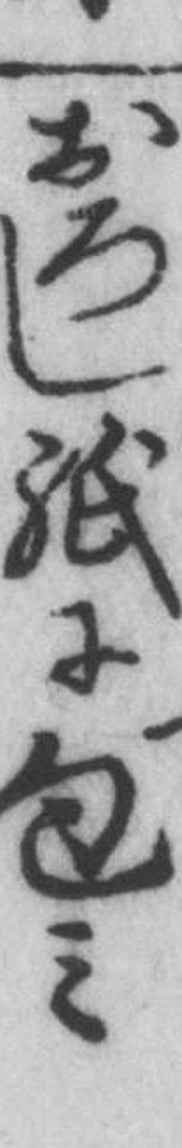おろし紙に包み
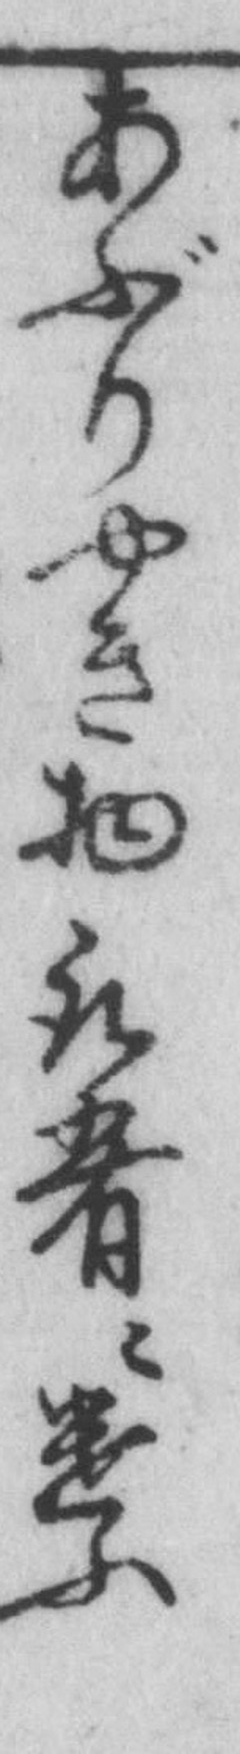あぶりやき物取肴に遣ふ
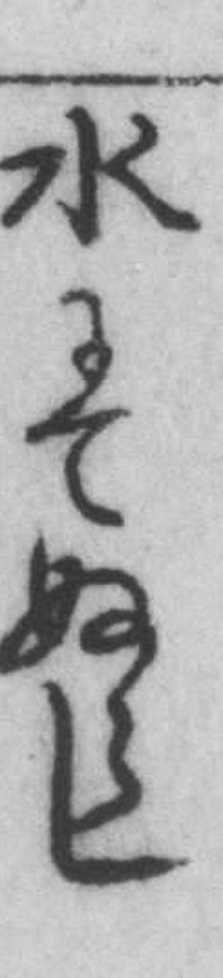水にてぬらし
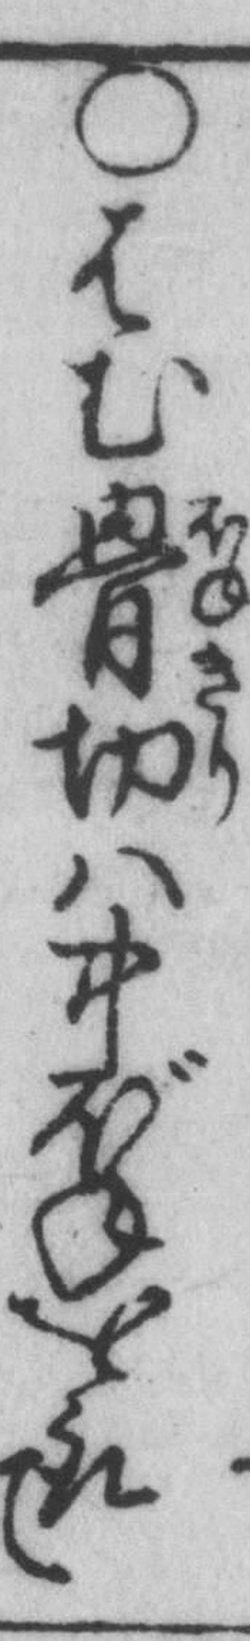○はむ骨切は中ぼねを取て
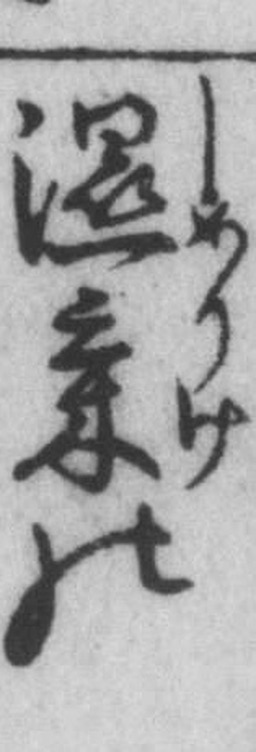湿気の
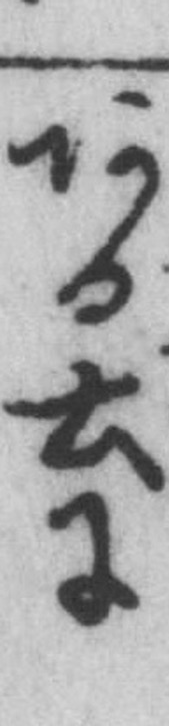ある土に
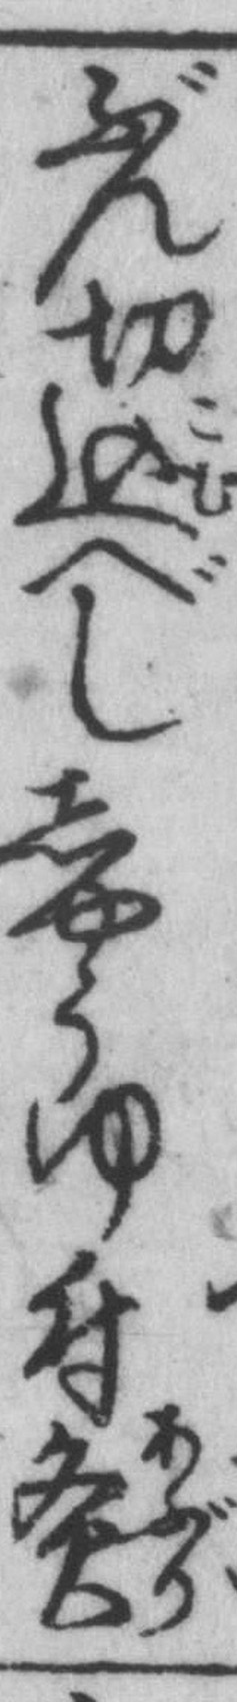ぶん切込べししやうゆ付炙
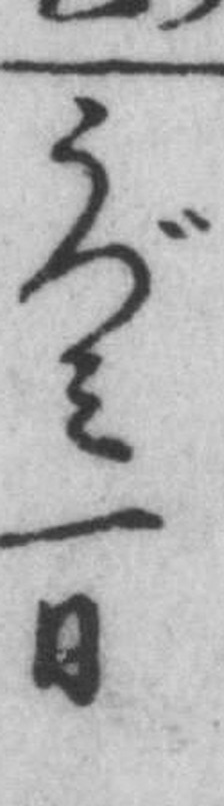うづみ一日
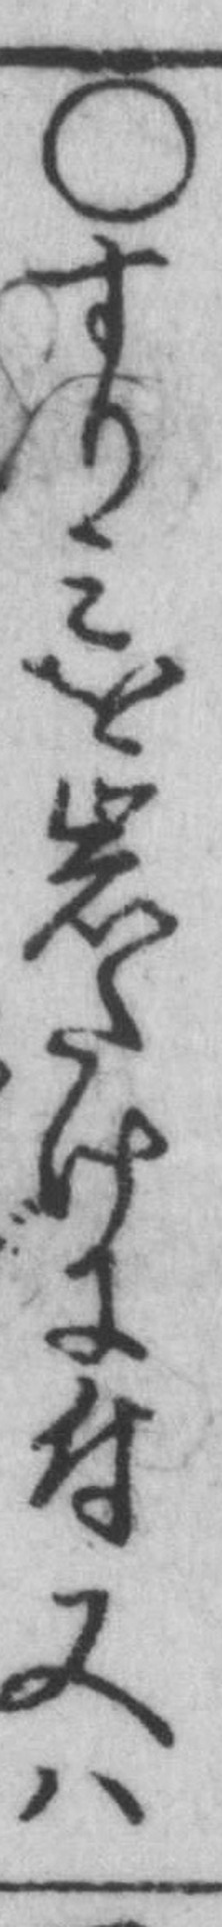○すりみを岩たけに付又は
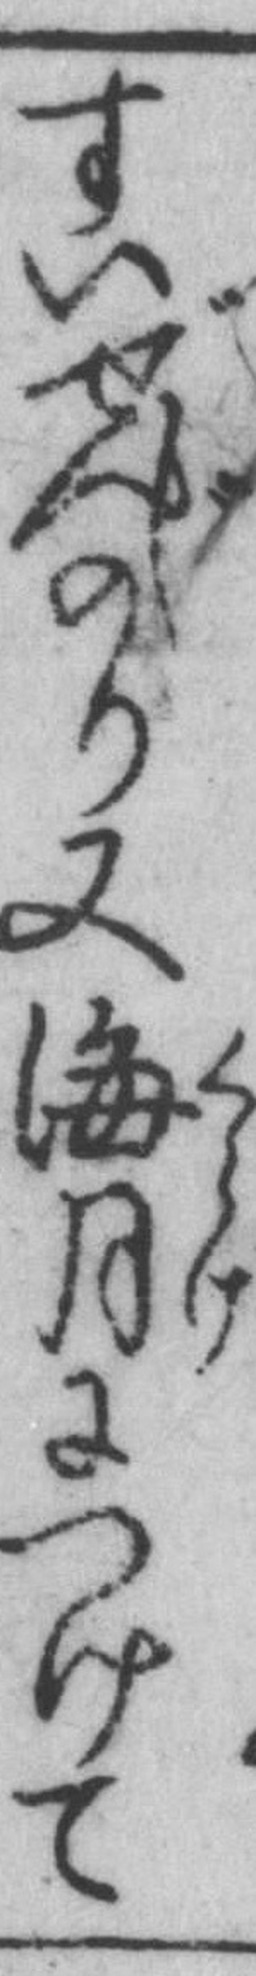すいせんじのり又海月につけて
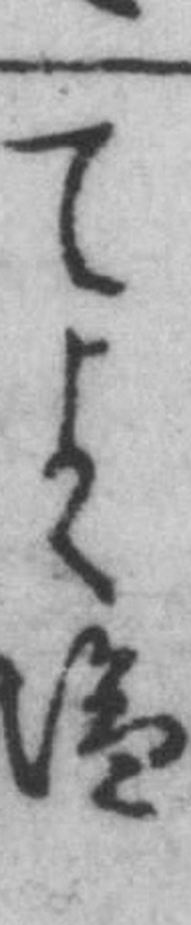てよく塩
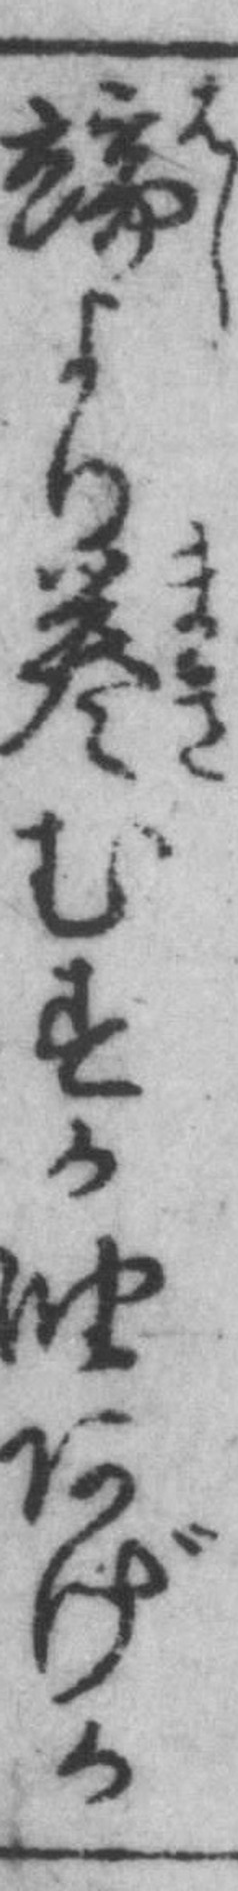端より巻むすか油あげか
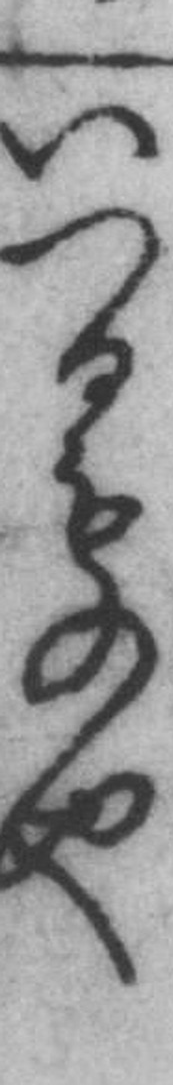いづるものや

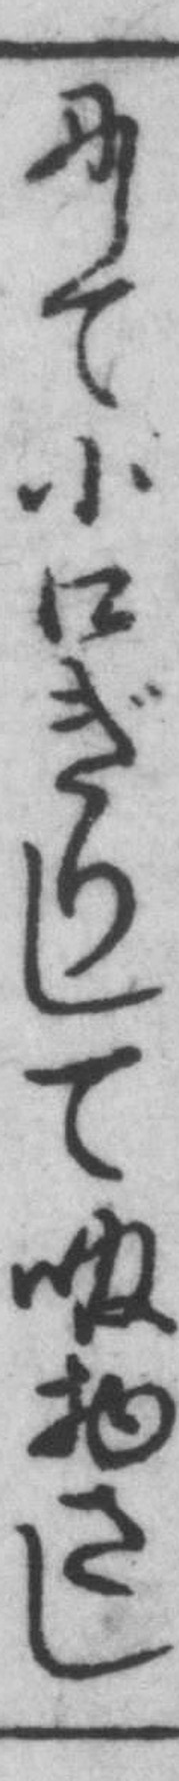にて小口ぎりして吸物さし
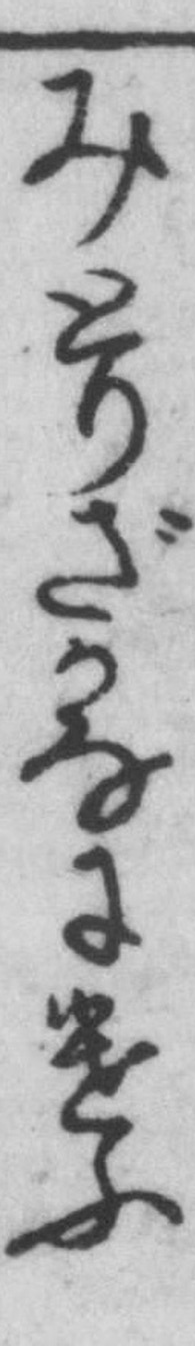みとりざかなに遣じ
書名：料理献立抄
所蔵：大阪府立大学学術情報センター 国文学研究資料館
